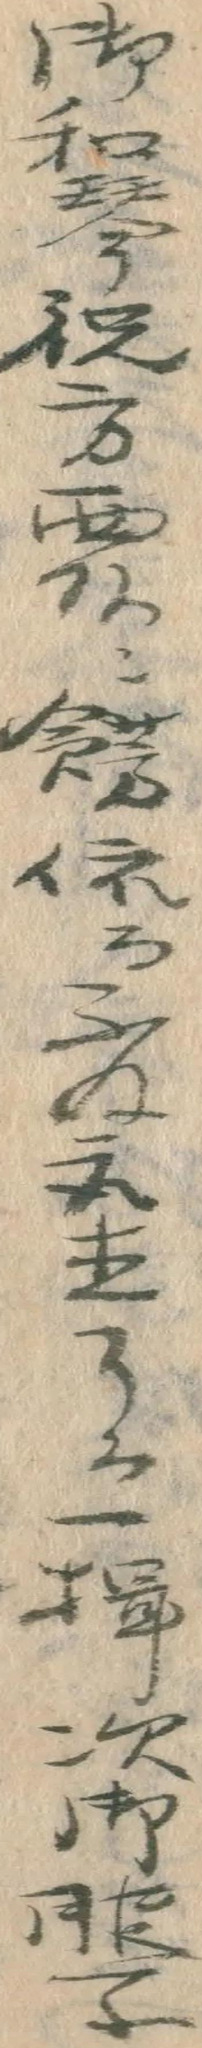御和琴祝方西頭ニ餝依而ふね取直了而一揖次御服所
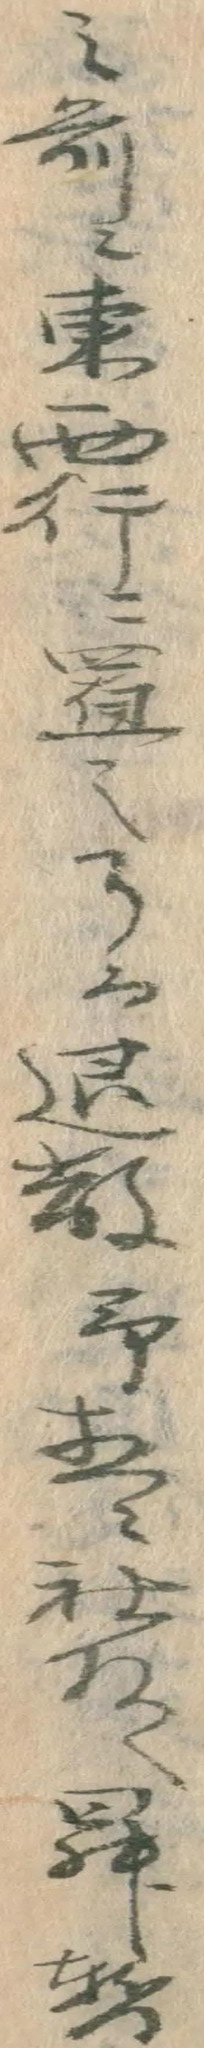之前ニ東西行ニ置之了而退散予直ニ社頭へ昇暫
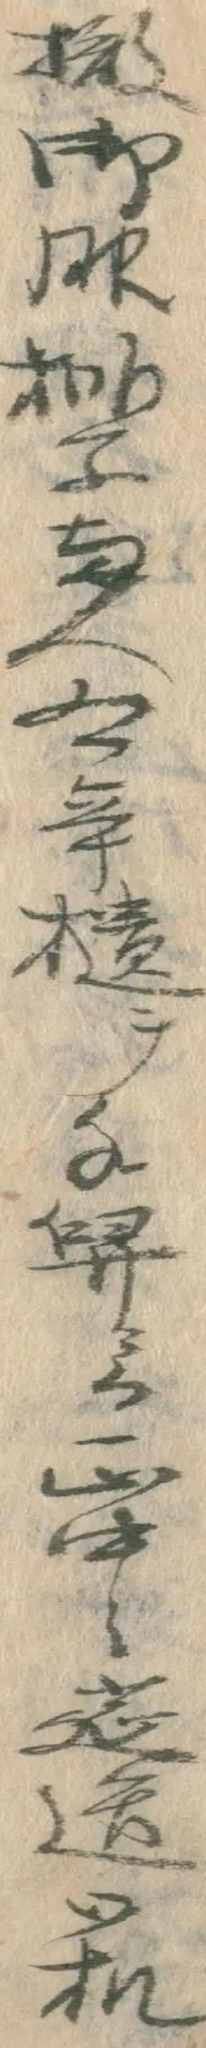撤御服棚所両人為辛櫃ヲ手舁ニ而正中之筵遁御机

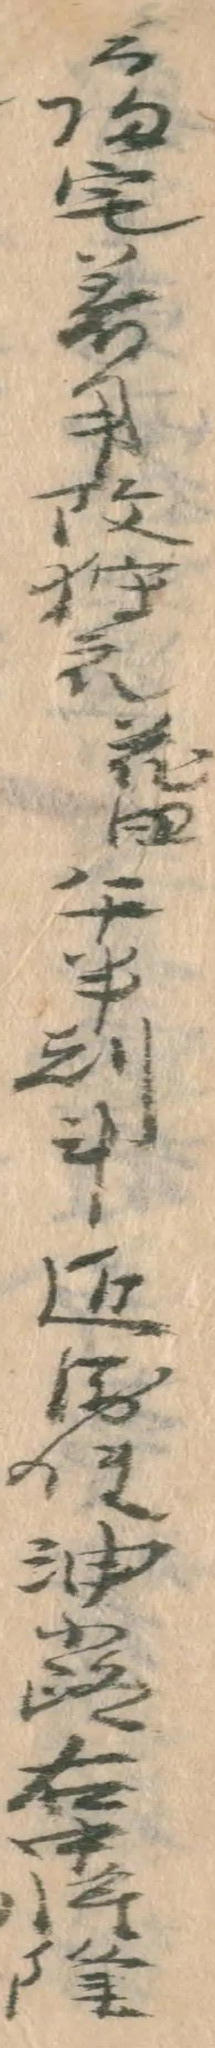而帰宅着用改狩衣花紐午半刻斗近衛使油小路右中将隆
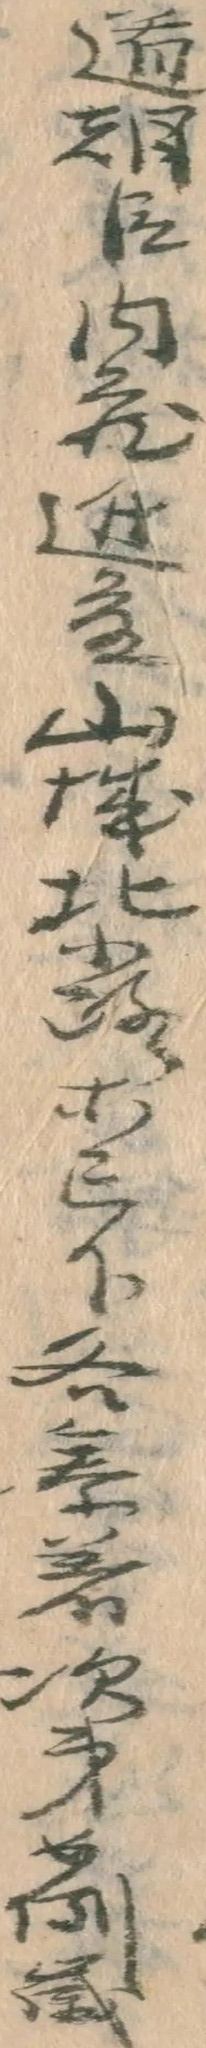道朝臣内蔵近藤山城北小路等已下各参着次第如例歳
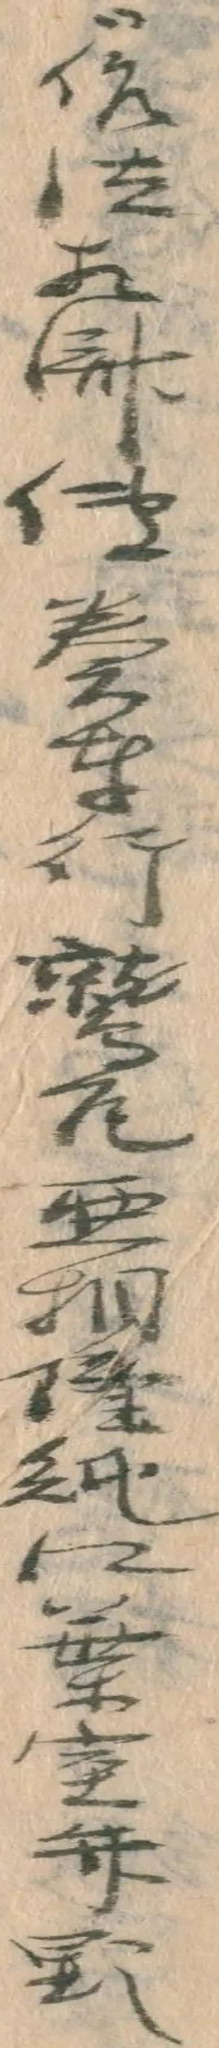御作法相済傳奏奉行鷲尾亜相隆純卿葉室并顕
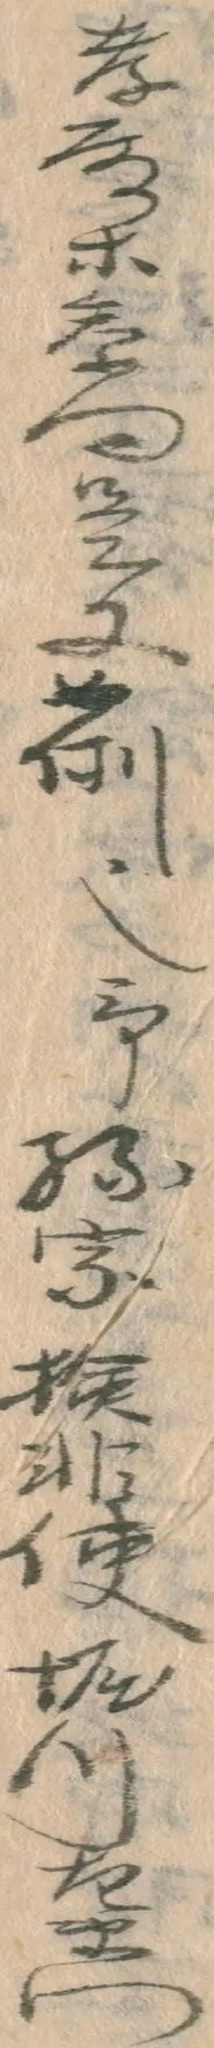孝殿等参向是又如例也予縁家検非使堀川左衛門
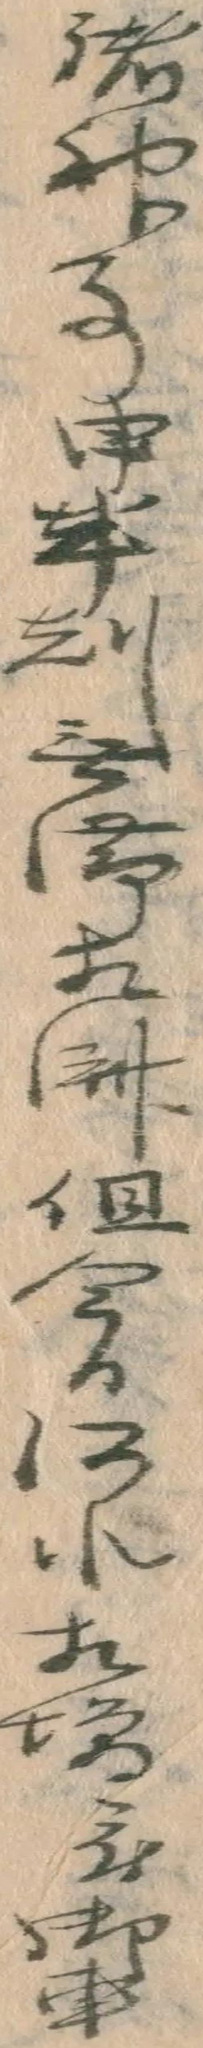諸神事申半刻無滞相済但今日御水相増ニ付御車
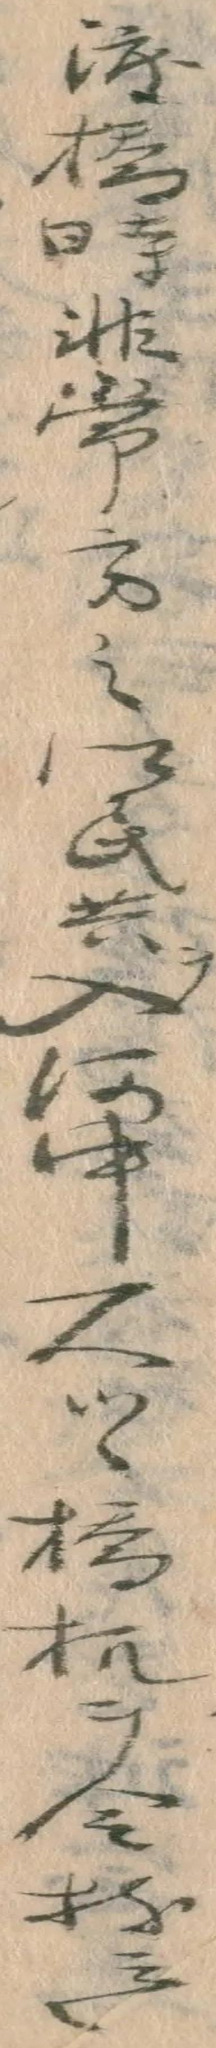渡橋時非常方之郷民共ヲ入河中一人ツヽ橋杭ヲ令持云々
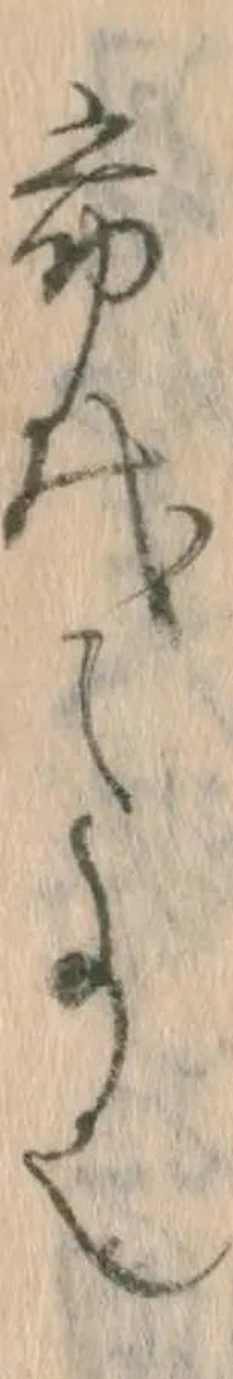希代之事也
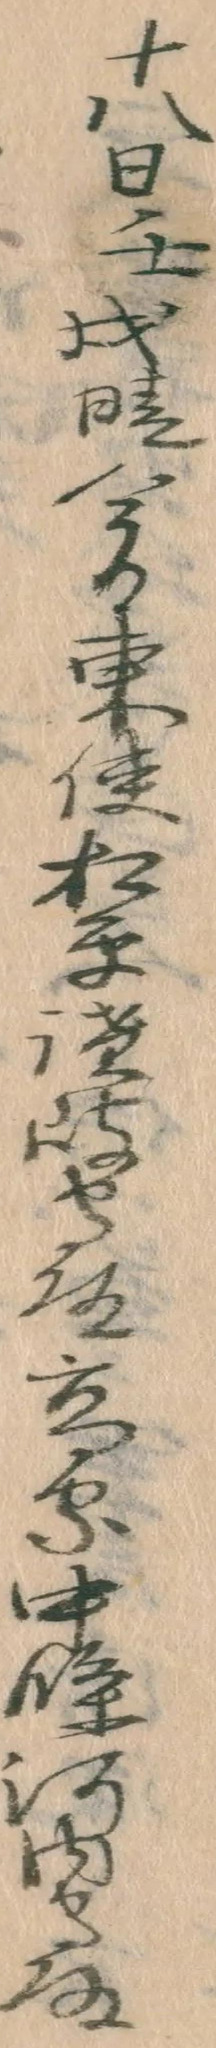十八日壬戌晴今日東使松平讃岐守殿高家中條河内守殿
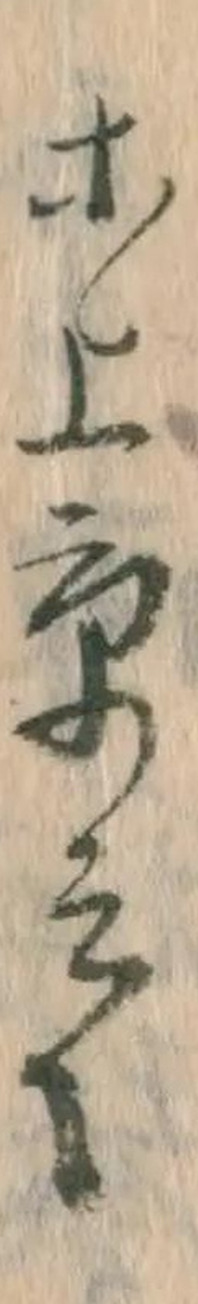等上京之義
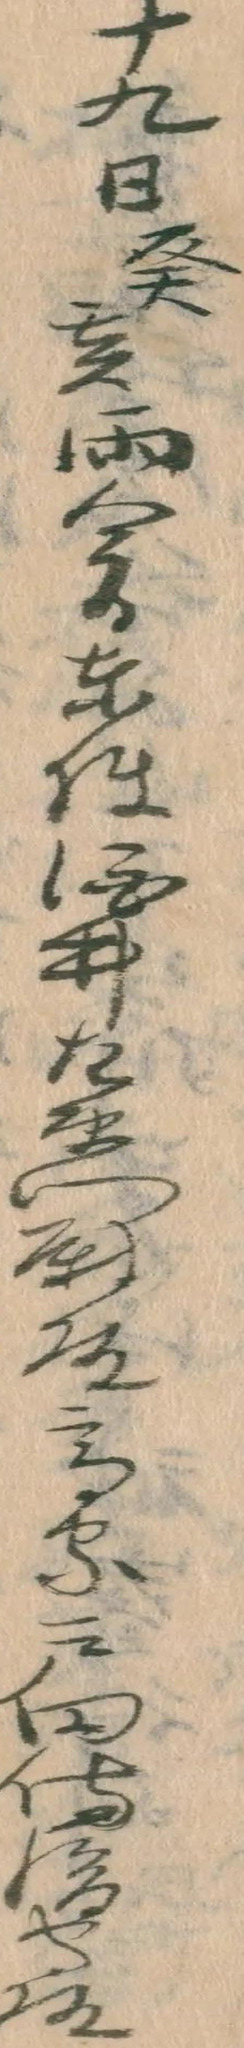十九日癸亥雨今日東牧酒井左衛門尉殿高家戸田備後守殿
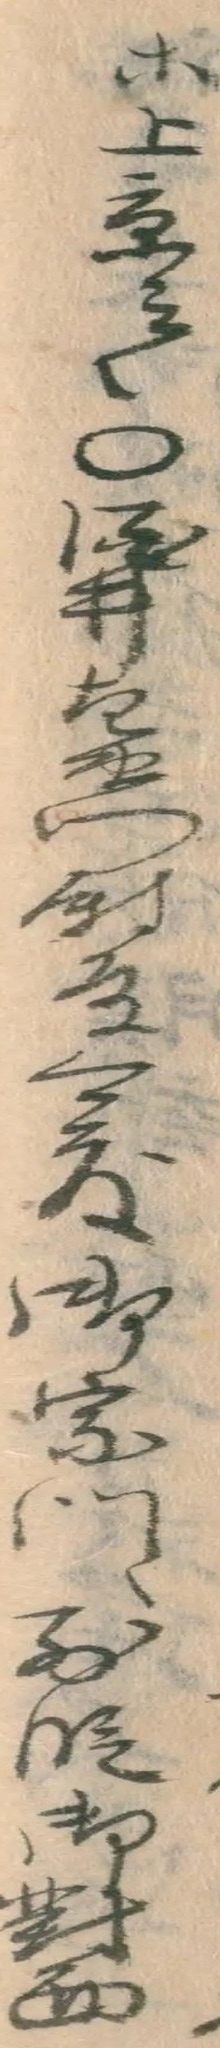等上京云〻○酒井左衛門尉殿今度御家門へ別段御對面
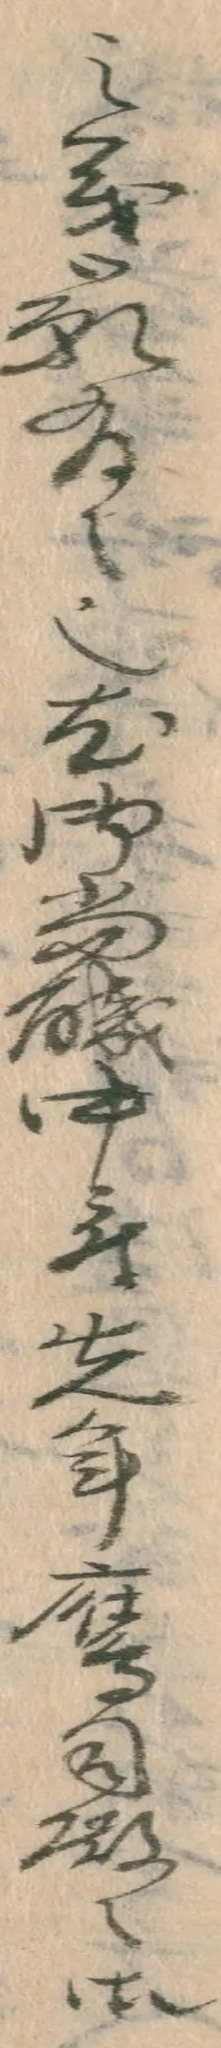之義御願有之也尤御當職中ニ付先年鷹司殿之御
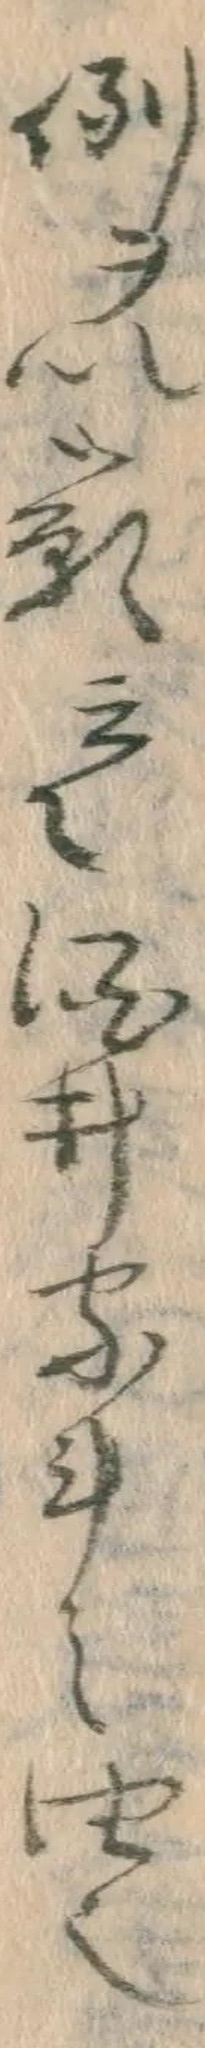例ヲ以御願云〻酒井家斗之由也
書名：賀茂社記録. 第63冊
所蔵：国立国会図書館 National Diet Library, JAPAN
